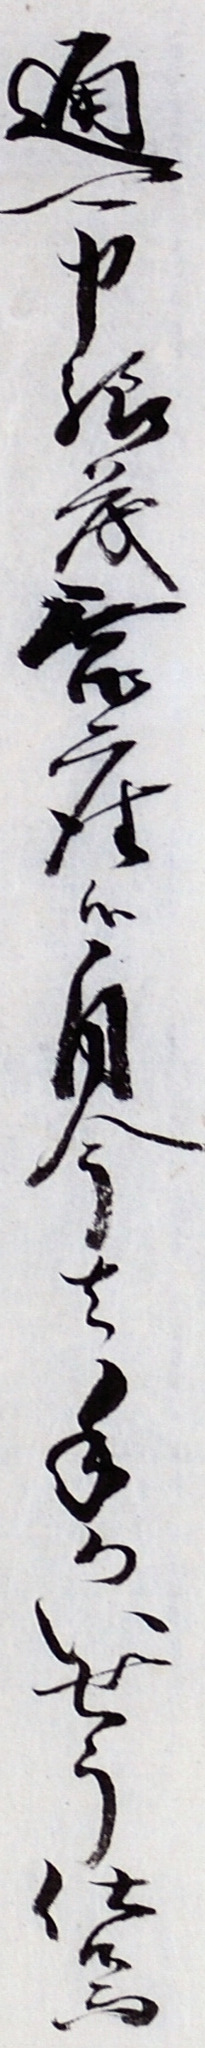通可申様茂無御座候自今は手かいせう仕候而
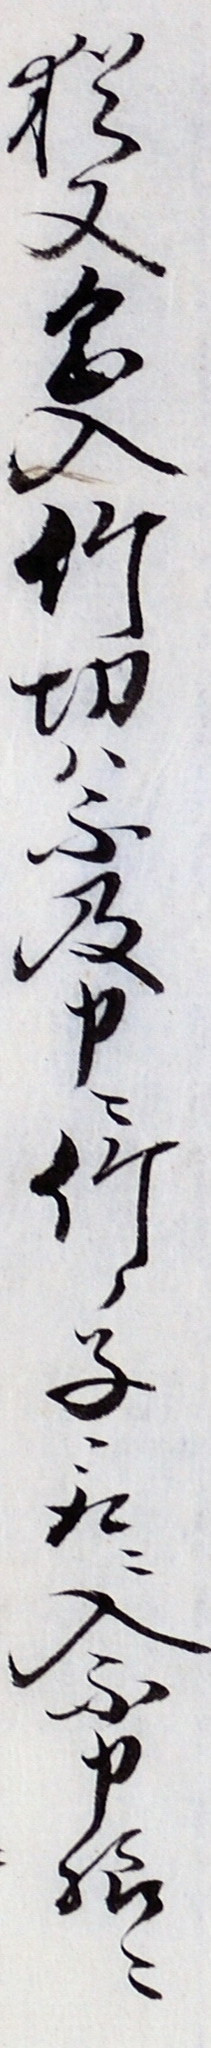猶又念入竹切ハ不及申ニ竹ノ子ニ取ニ入不申様ニ
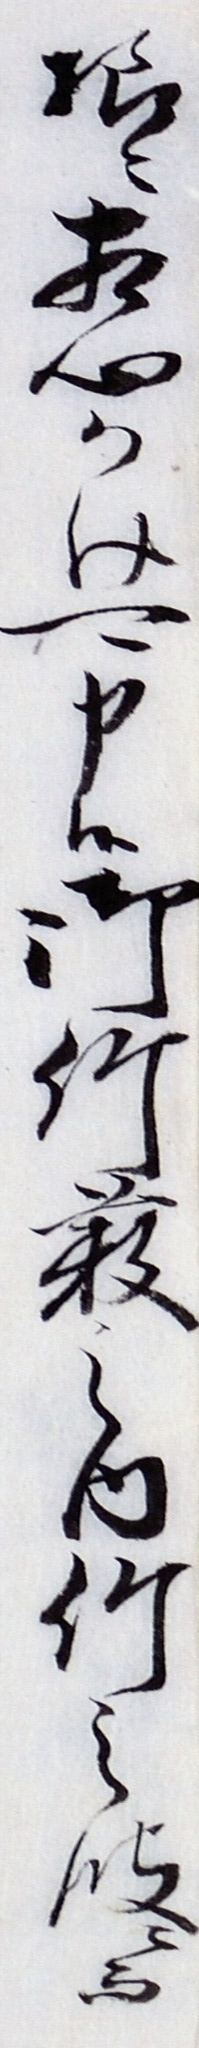様ニ相心かけ可申候御竹薮之内竹之皮ニ而
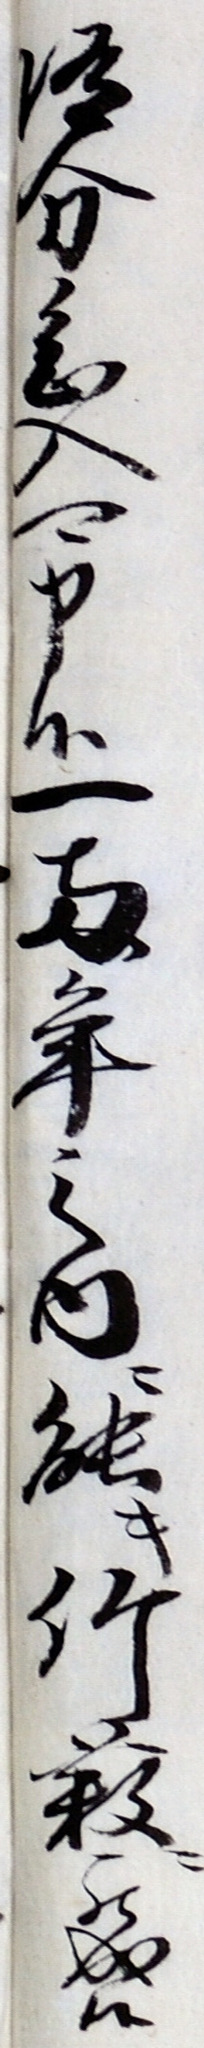随分念入可申候一両年之内ニ能キ竹薮ニ被成候
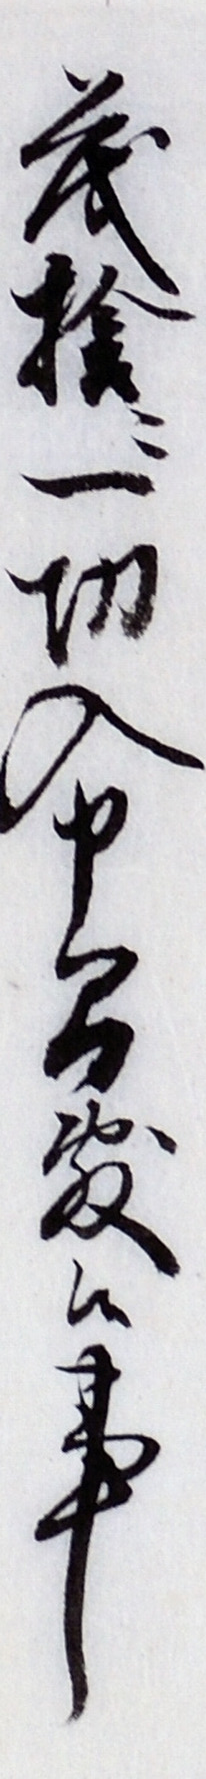も捨ニ一切入申間敷候事
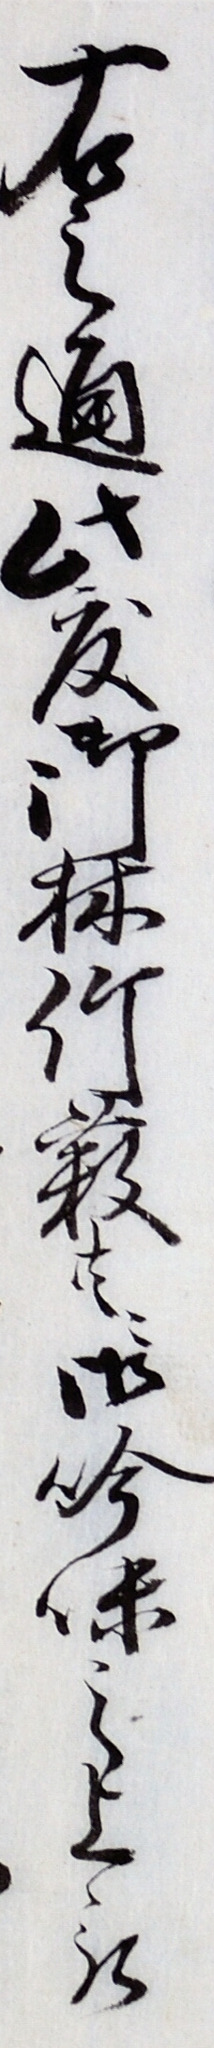右之通此度御林竹薮共ニ御吟味之上被
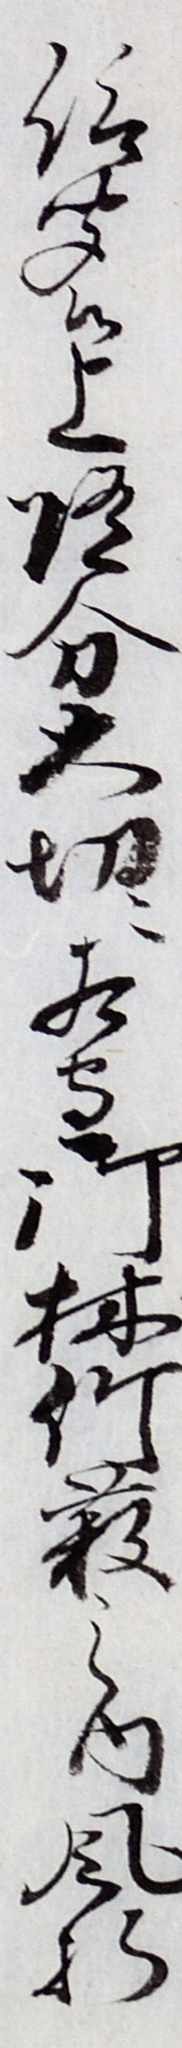仰聞候上随分大切ニ相守御林竹薮之内風折
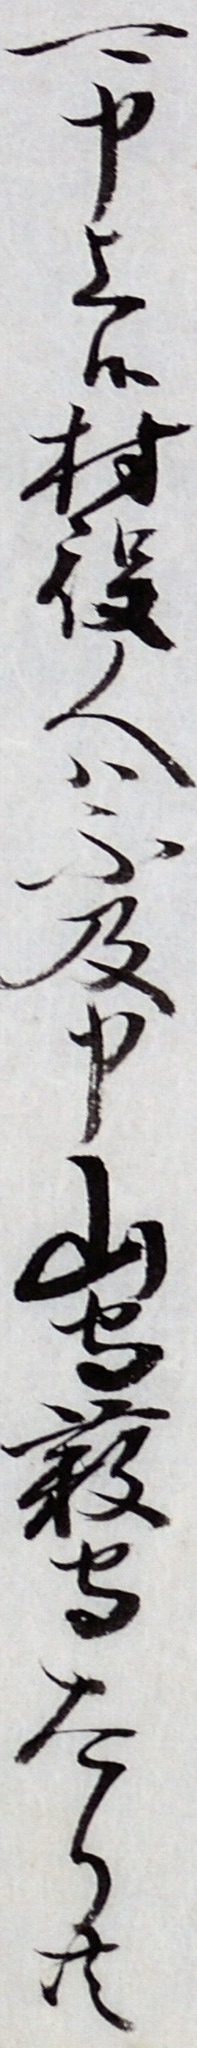可申上候村役人ハ不及申山守薮守たり共
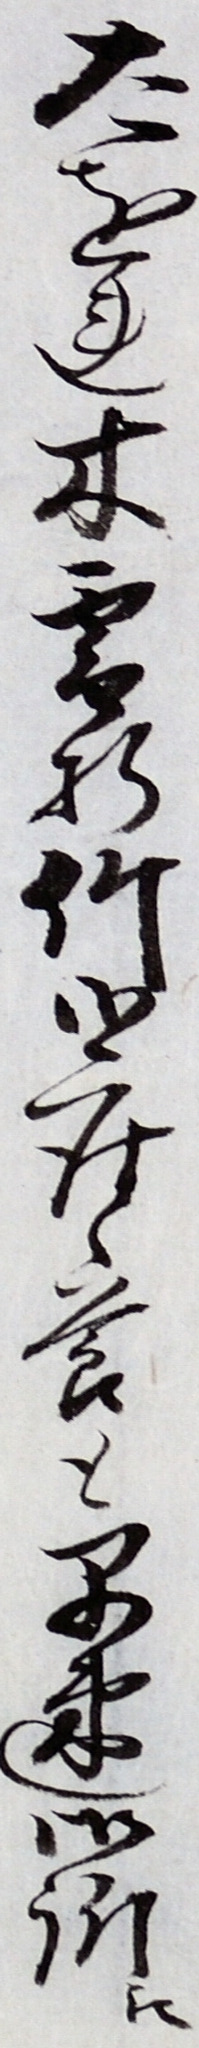たをれ木雪折竹御座候節も早速御訴え
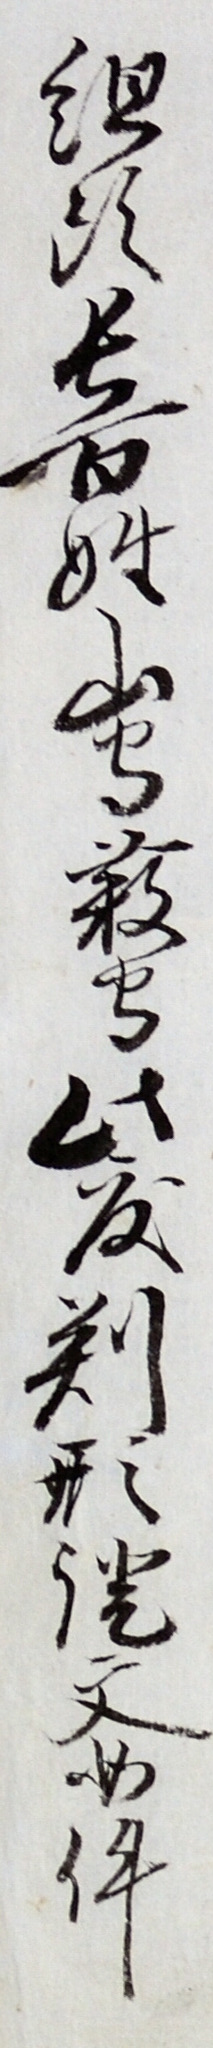組頭長百姓山守薮守此度判形証文如件
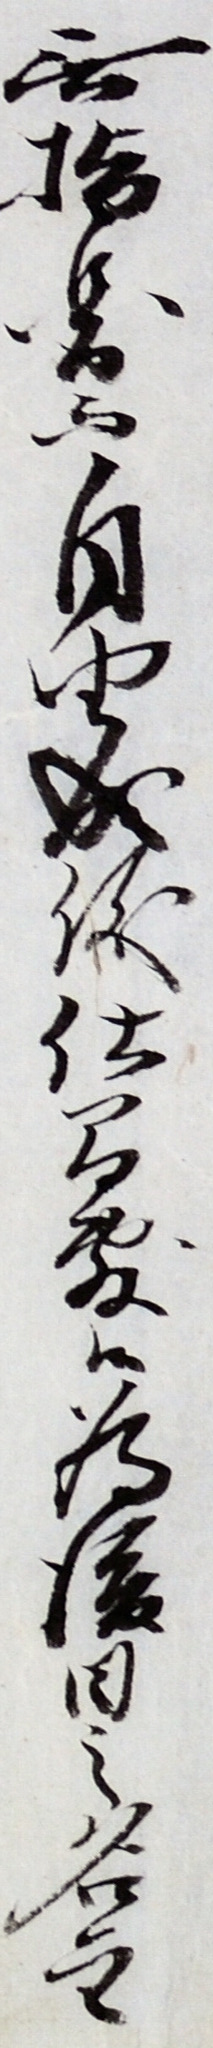無指図而自由成儀仕間敷候為後日之名主

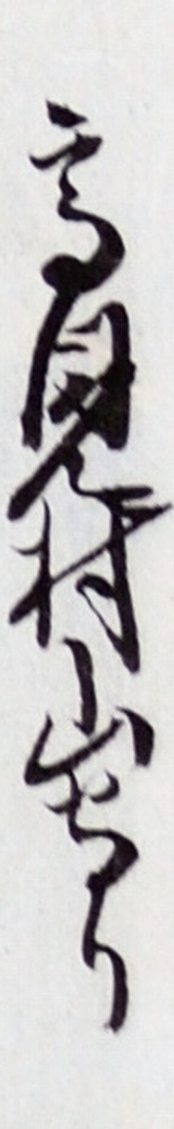高見村山守り
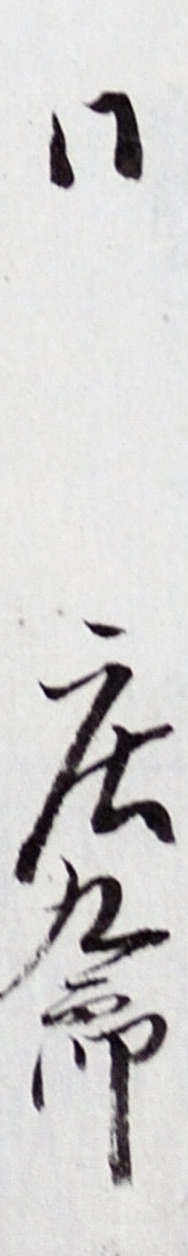同庄九郎
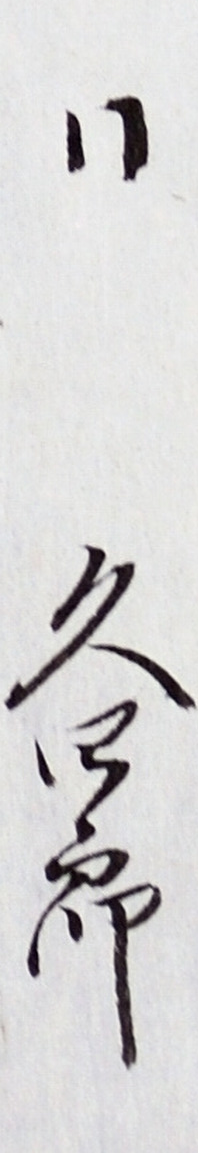同久四郎
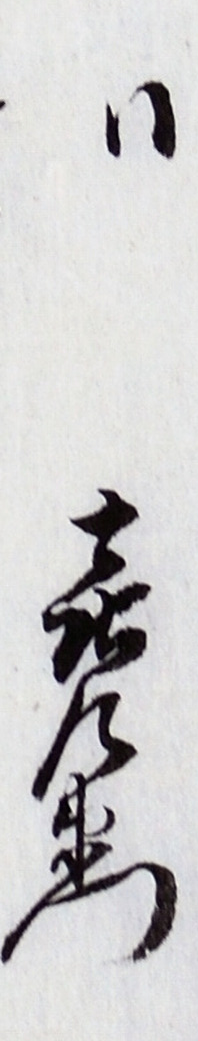同喜左衛門
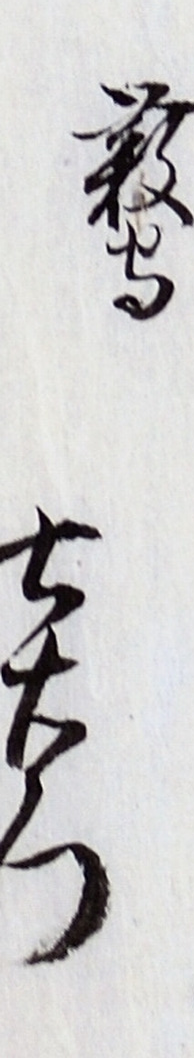薮守七右衛門
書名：御林御竹藪証文控
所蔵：伊那市立高遠町図書館・合同会社AMANE
